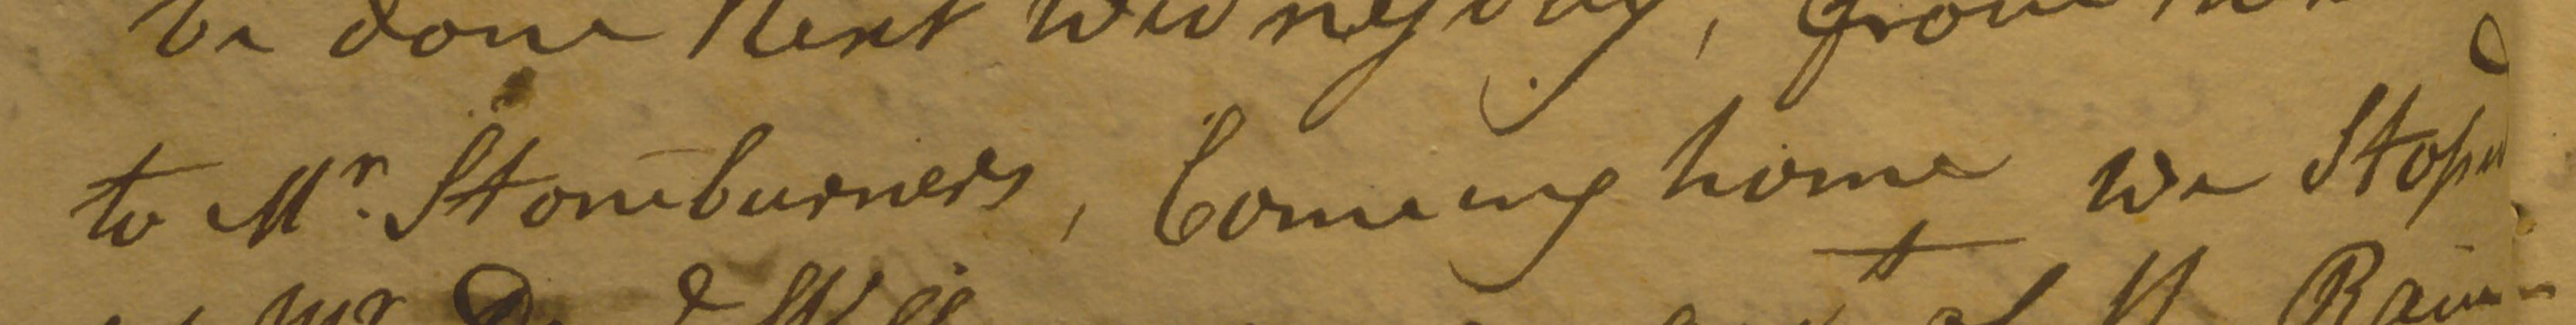to M^r. Stoneburners, Comeing home we Stoped
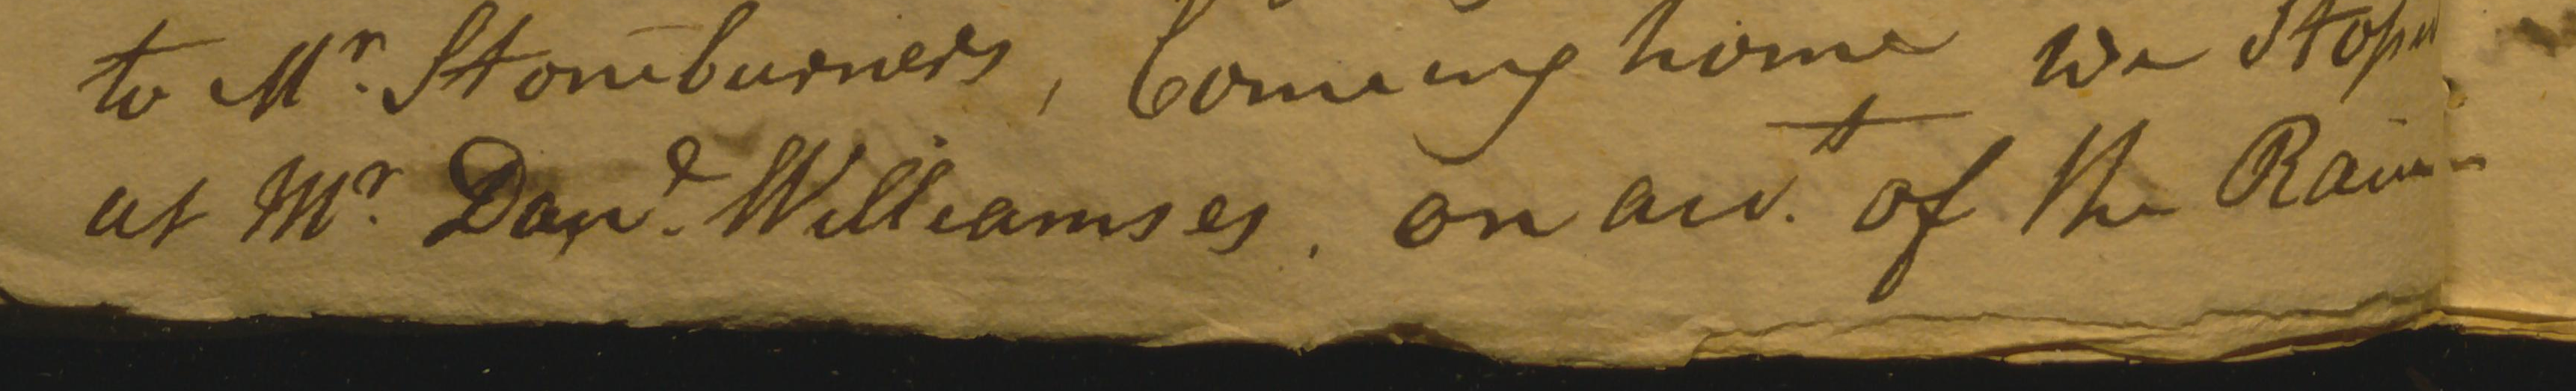at M^r. Dan^l. Williamses, on acct. of the Rain
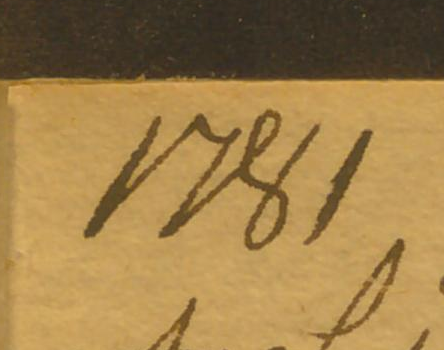1781
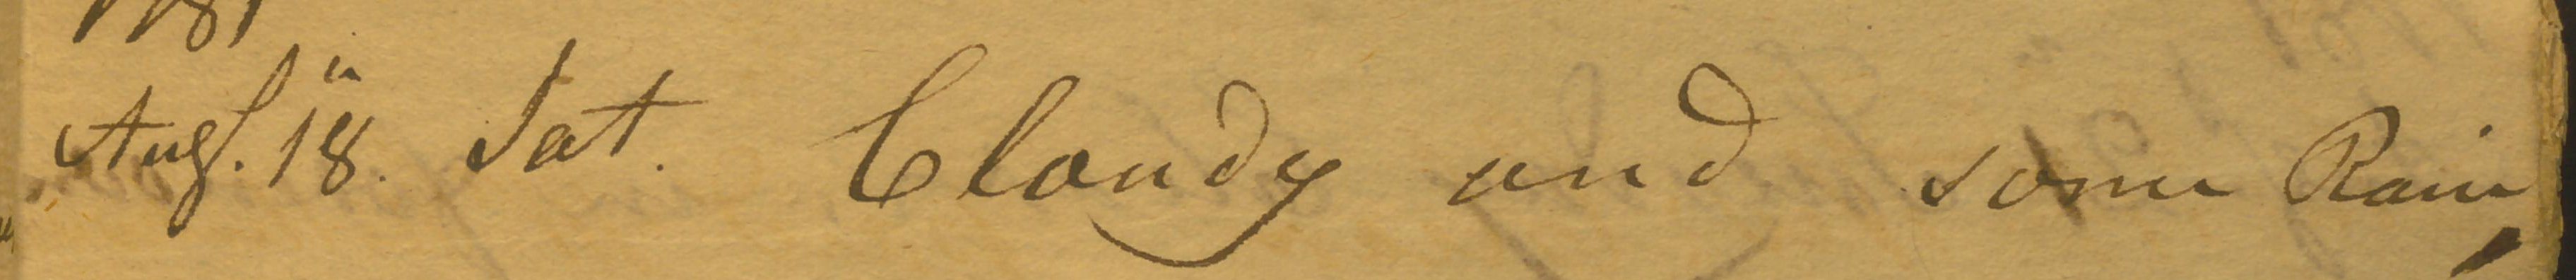Aug^t. 18^th Sat. Cloudy and some Rain
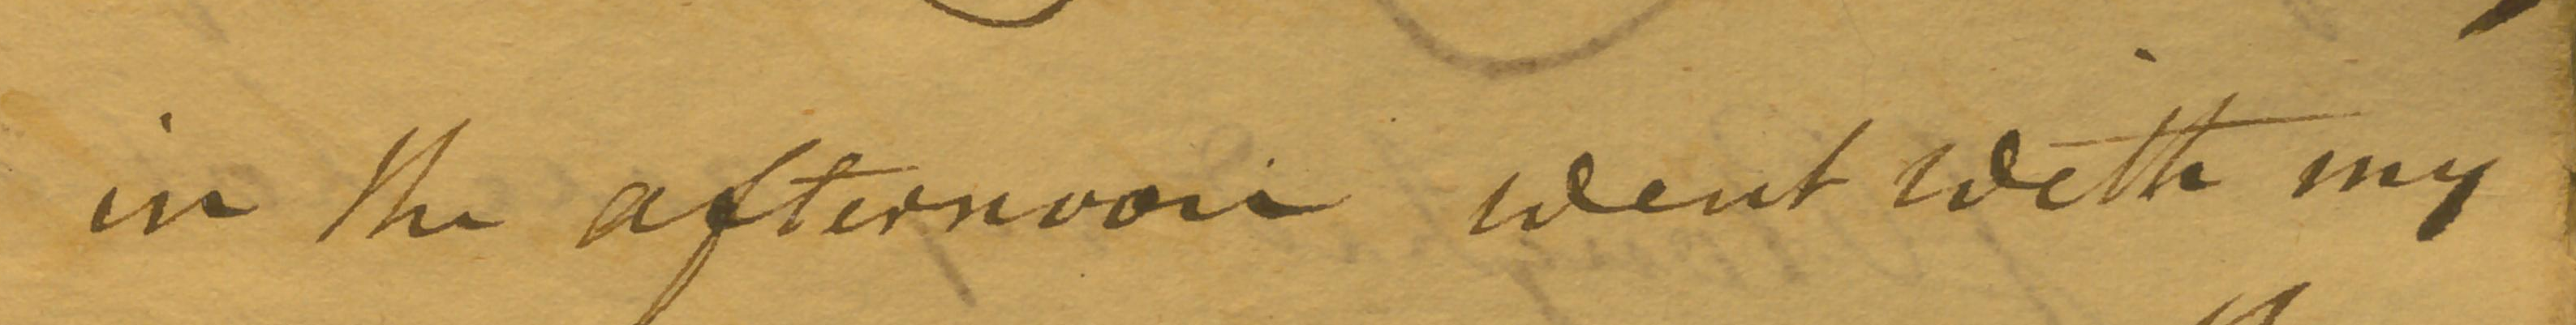in the afternoon went with my
